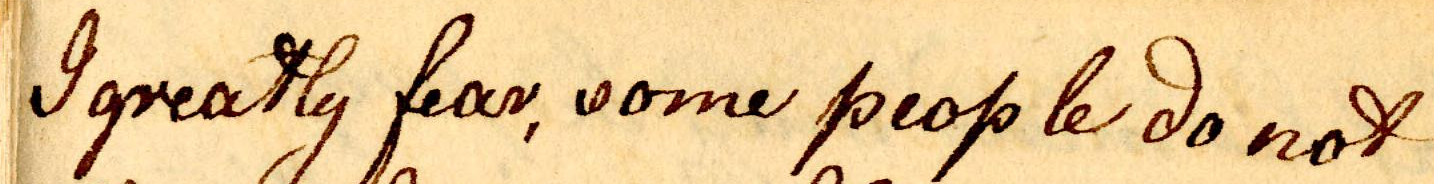I greatly fear, some people do not
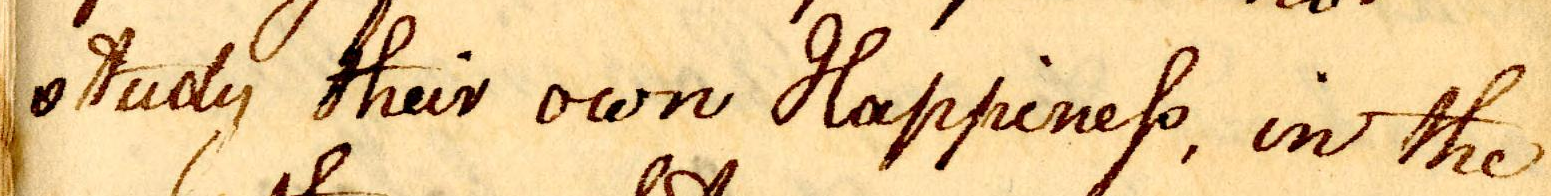study their own Happiness, in the
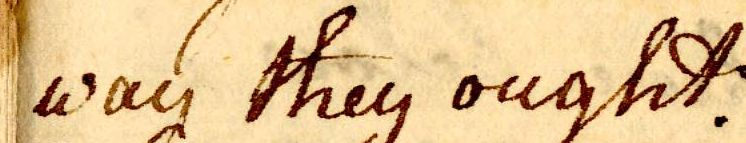way they ought.
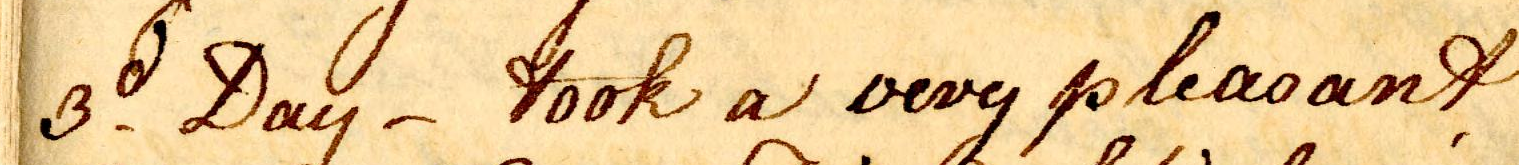3^d. Day- took a very pleasant
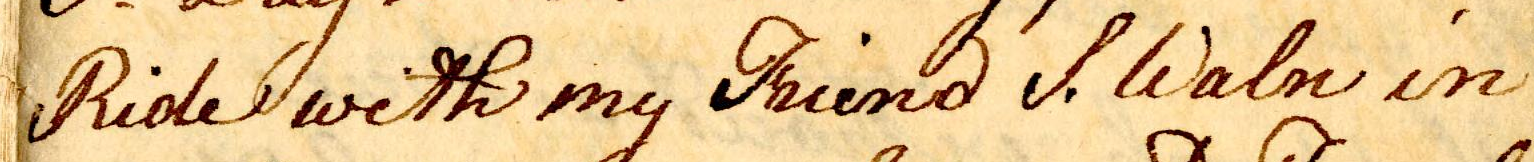Ride with my Friend S. Waln in
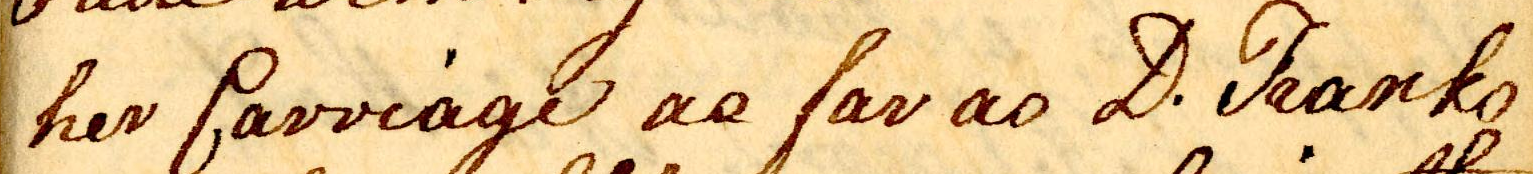her Carriage as far as D. Franks
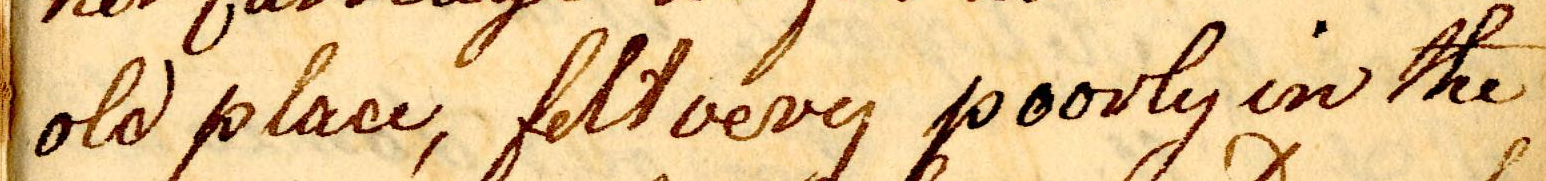old place, felt very poorly in the
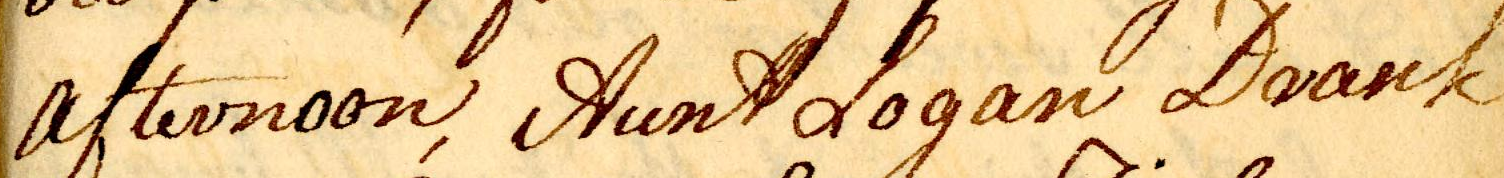Afternoon, Aunt Logan Drank
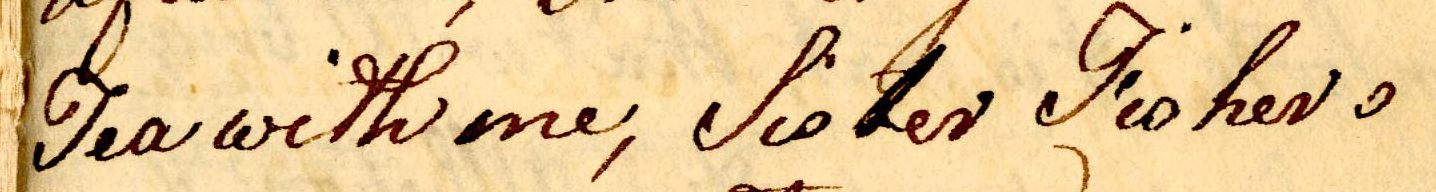Tea with me, Sister Fishers
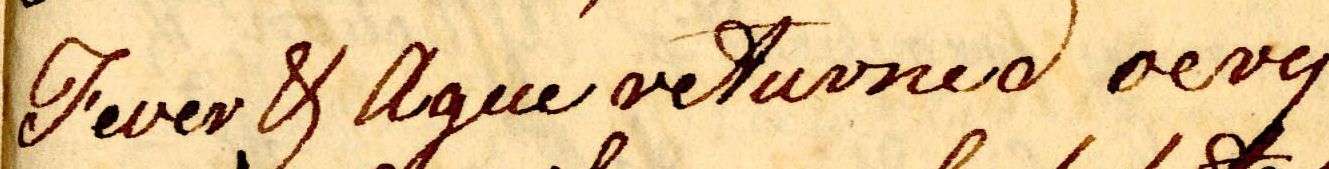Fever & Ague returned very
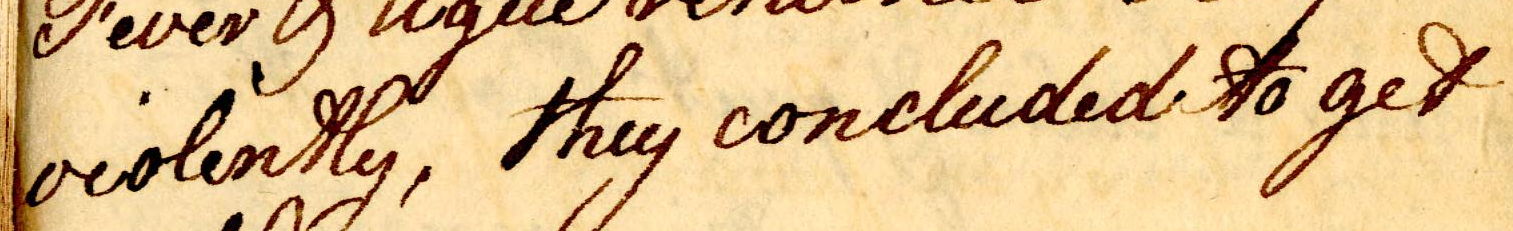violently, they concluded to get
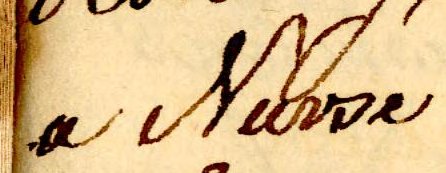a Nurse
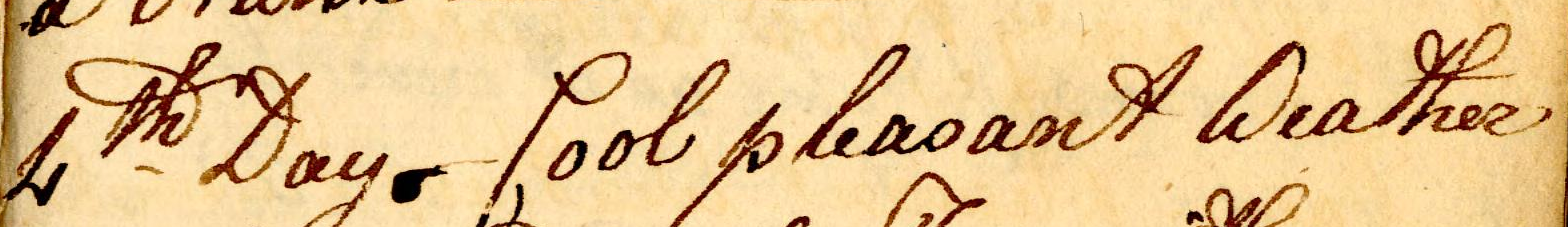4^th Day. Cool pleasant Weather
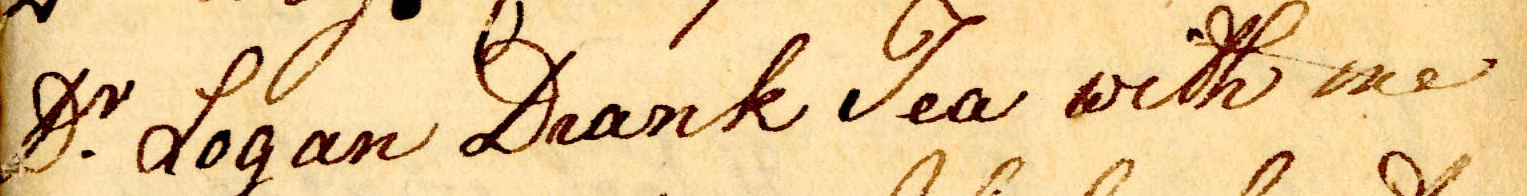D^r. Logan Drank Tea with me
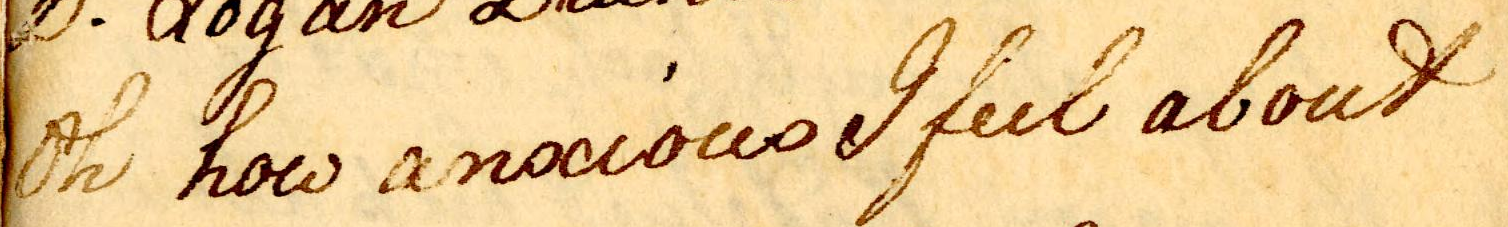Oh how anxious I feel about
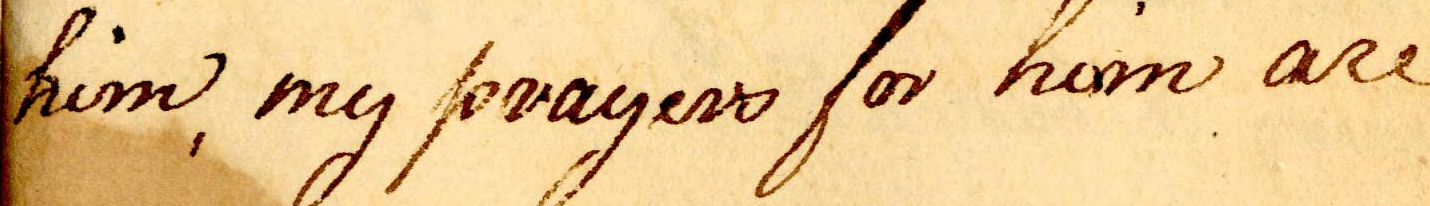him, my prayers for him are
